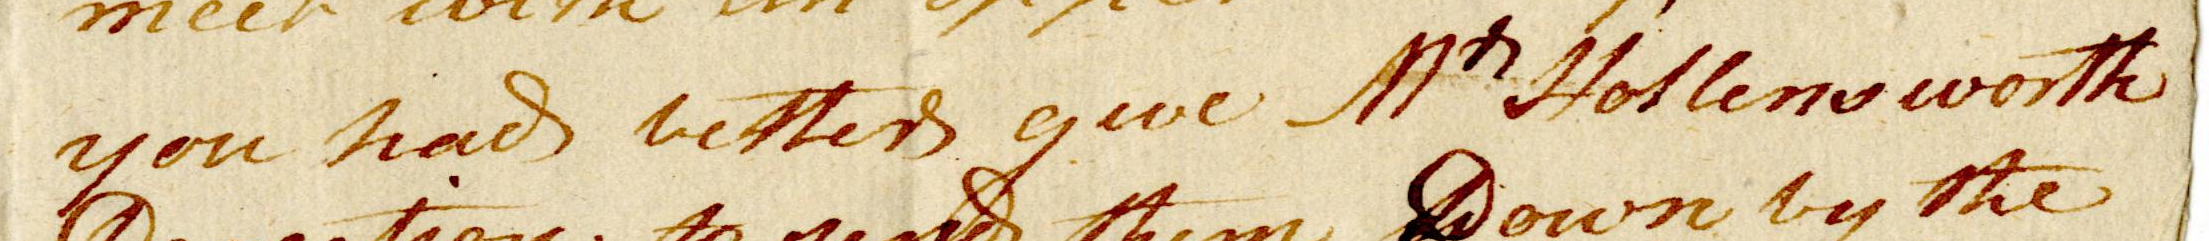you had better give M^r. Hollensworth
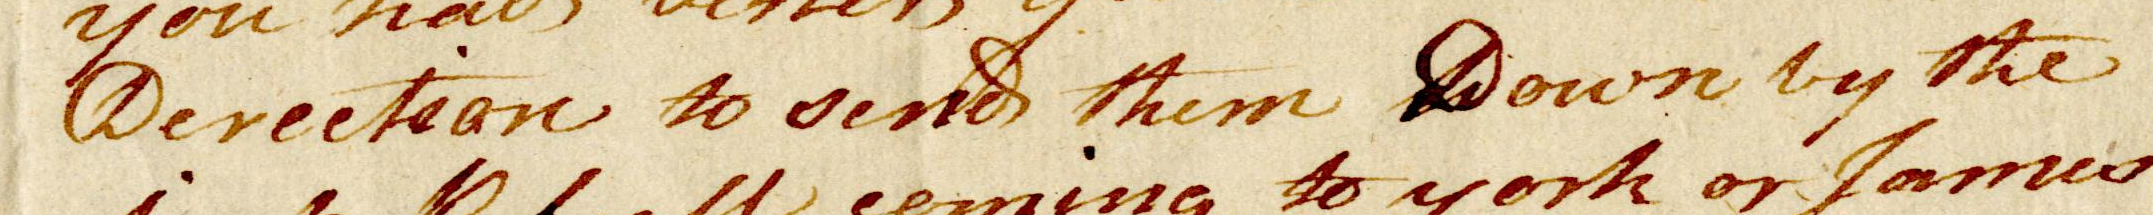Derection to send them Down by the
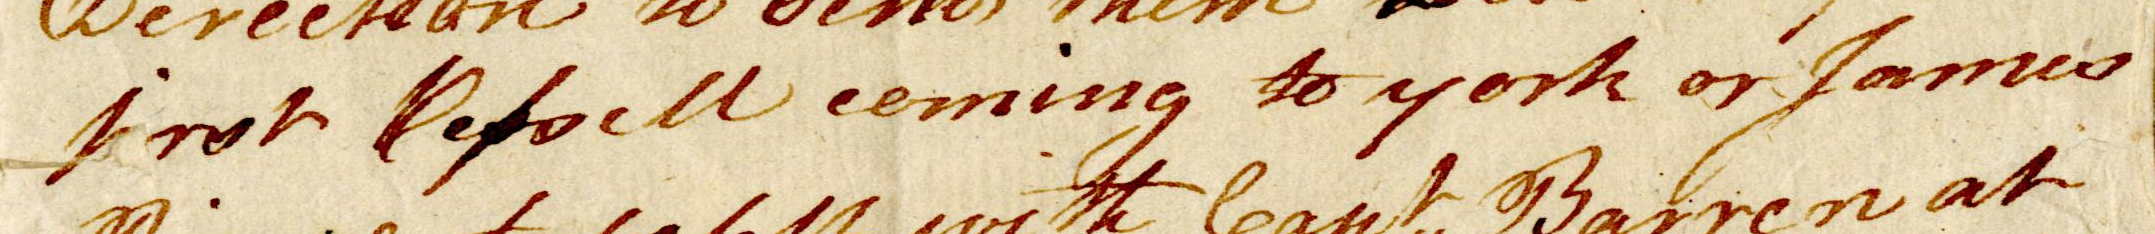first Vessell coming to York or James
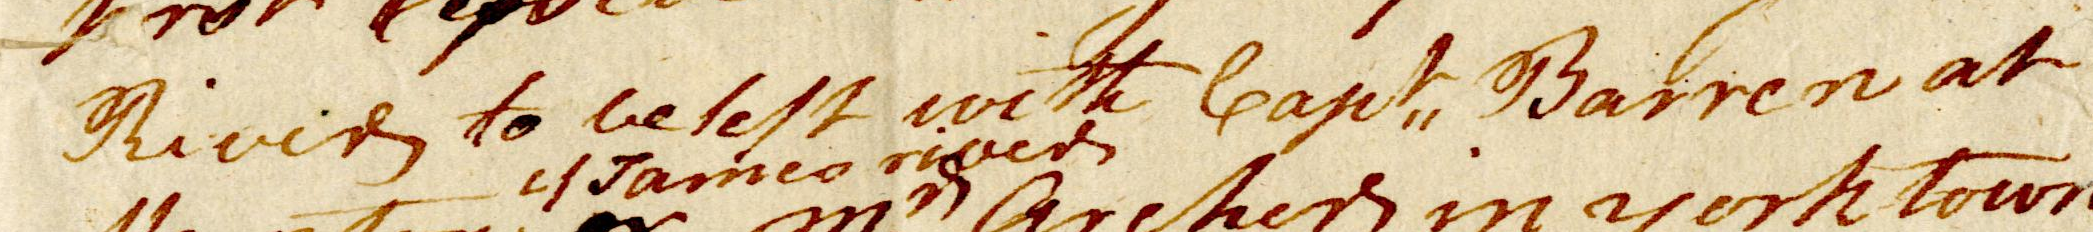Rivers to befest with Cap^t. Barren at
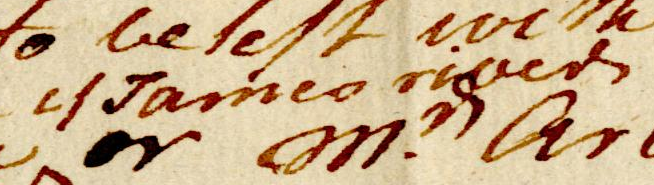James Rivers
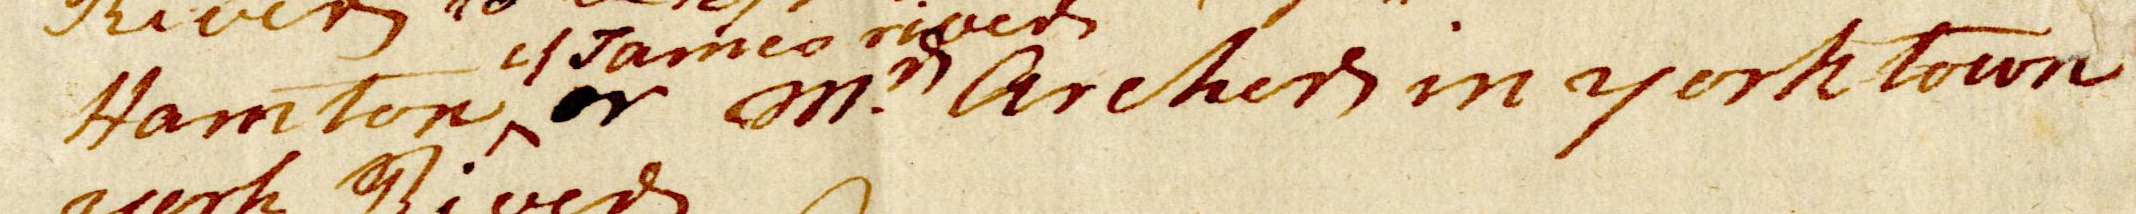Hamton or M^r: Archers in Yorktown
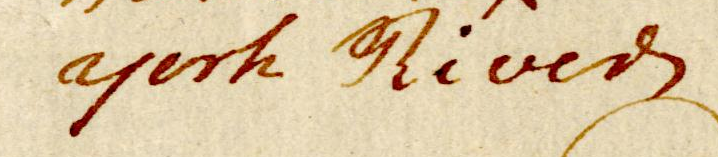York Rivers
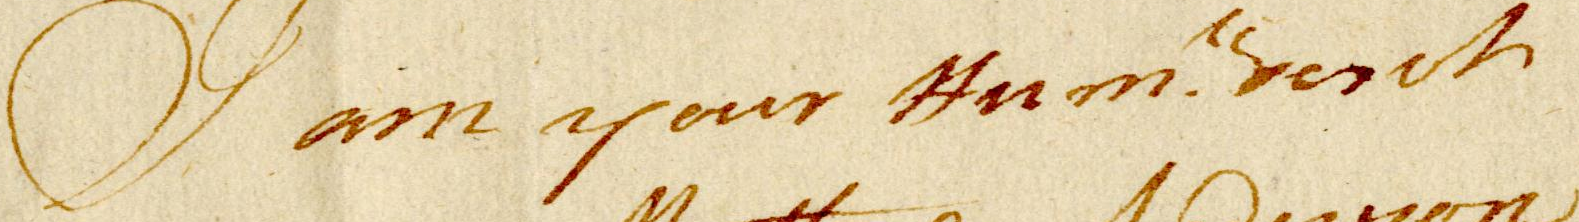I am your Hum^le Serv^t
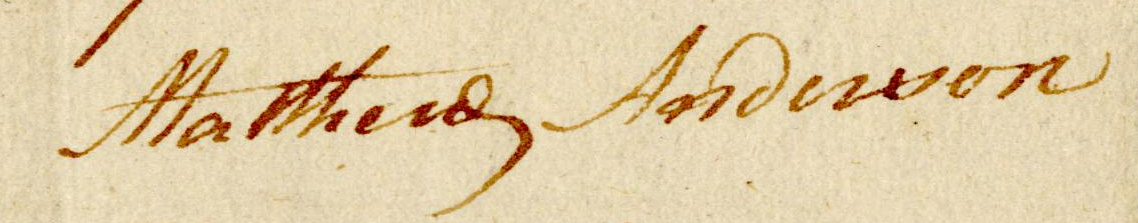Matthew Anderson
